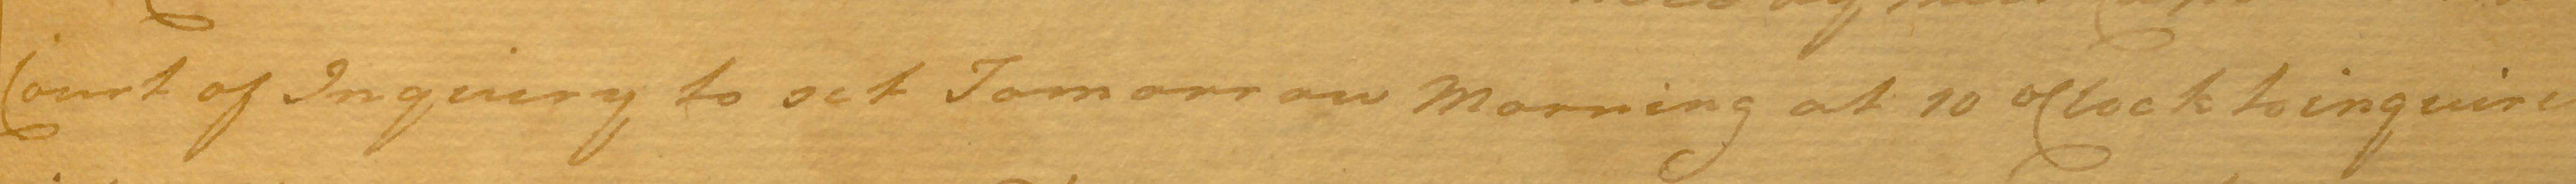Court of Inquiry to set Tomorrow Morning at 10 ^oClock to inquire
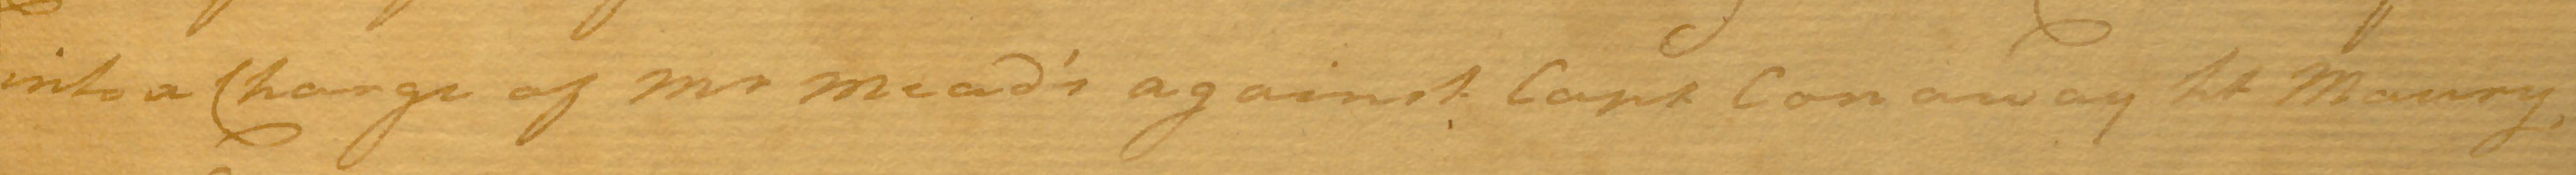into a Charge of M^r Mead's against Capt Conaway Lt Maury,
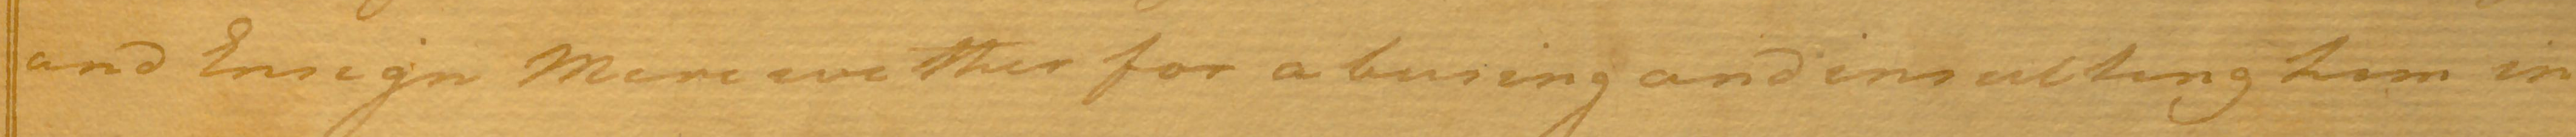and Ensign Merewether for abusing and insulting him in
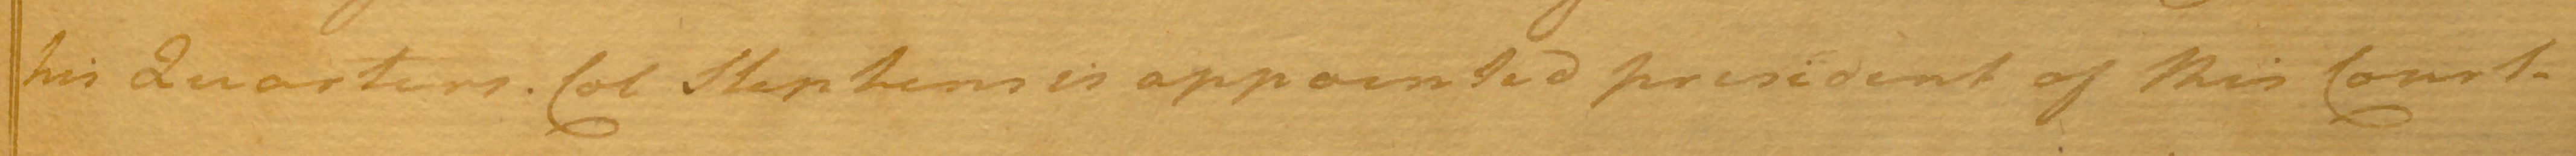his Quarters. Col Stephens is appointed president of this Court.
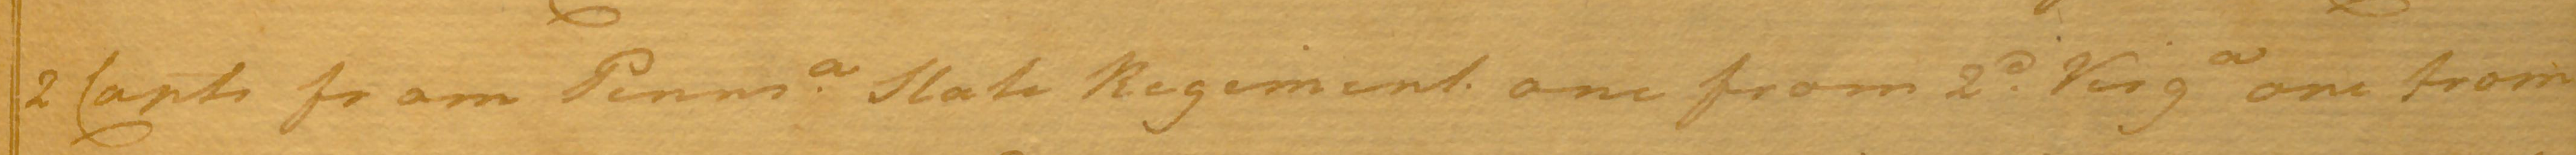2 Capts from Penns^a. State Regiment one from 2^d. Virg^a one from
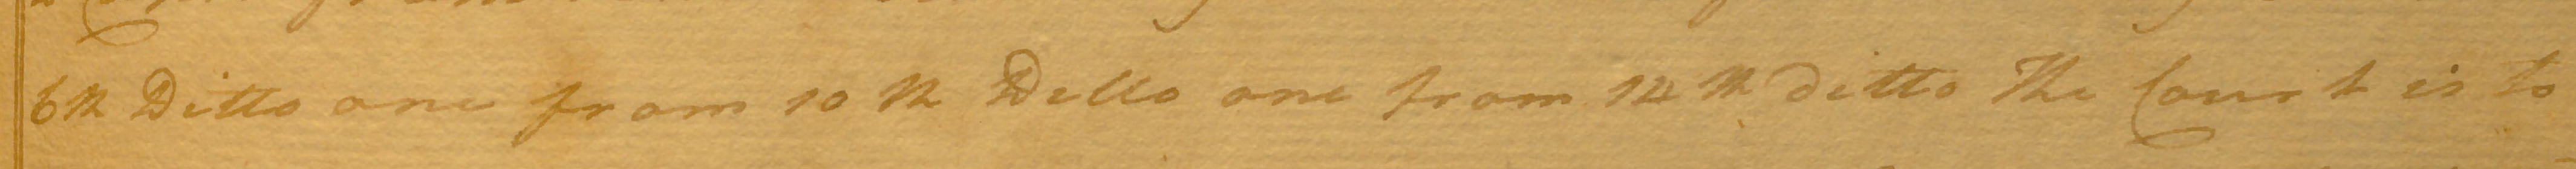6th Ditto one from 10th Ditto one from 14th ditto The Court is to
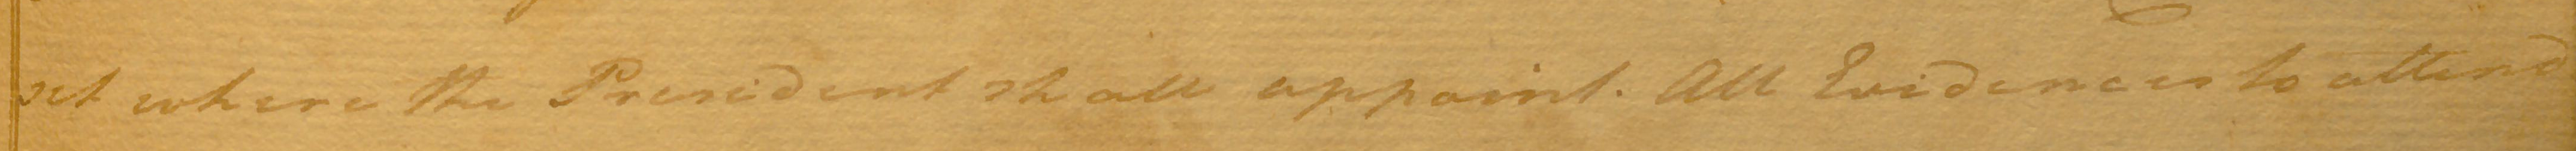set where the President shall appoint. All Evidences to attend
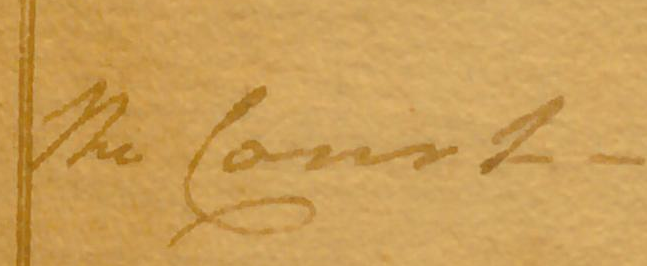the Court-
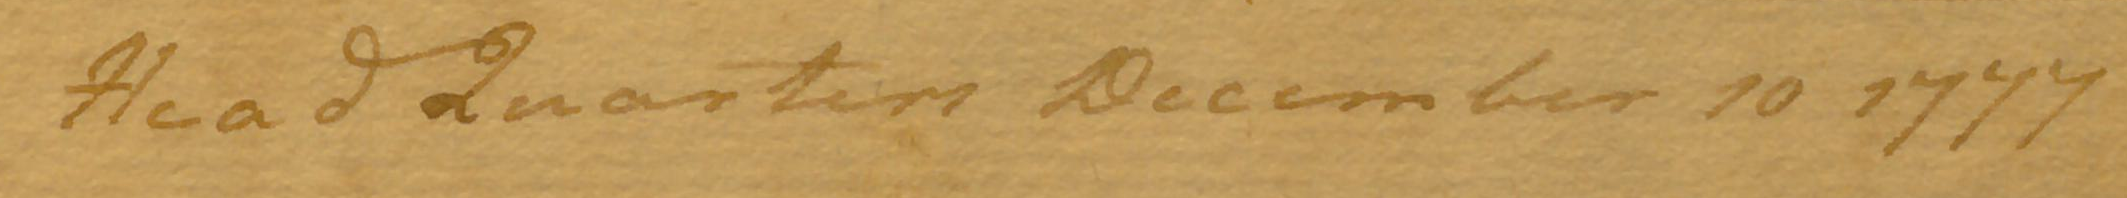Head Quarters December 10 1777
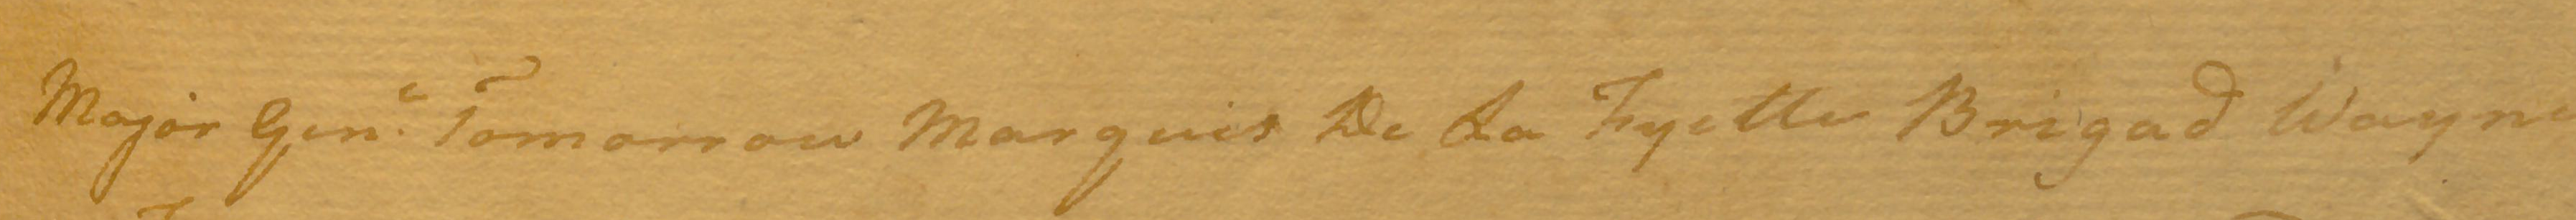Major Gen^l. Tomorrow Marquis De La Fyette Brigade Wayne
